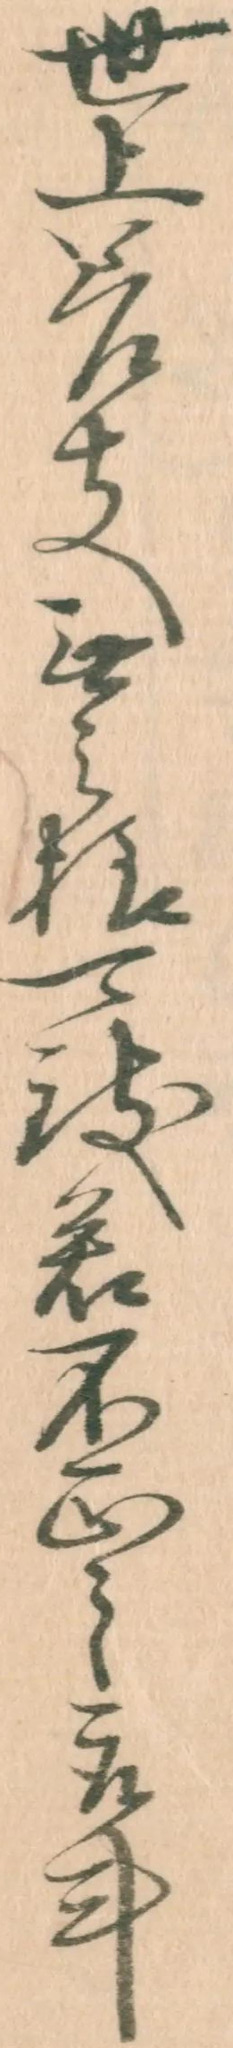世上差支無之様可致若不正之取計
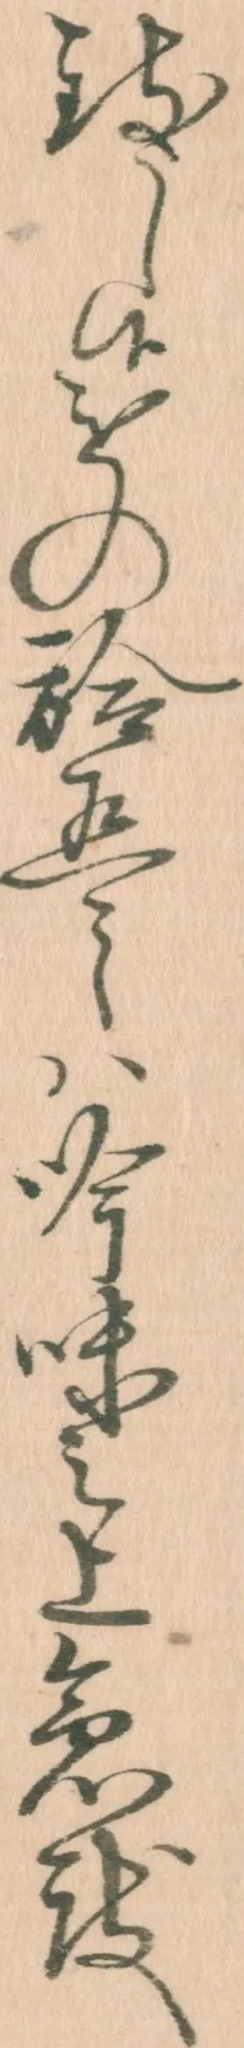致し候もの於有之ハ吟味之上急度
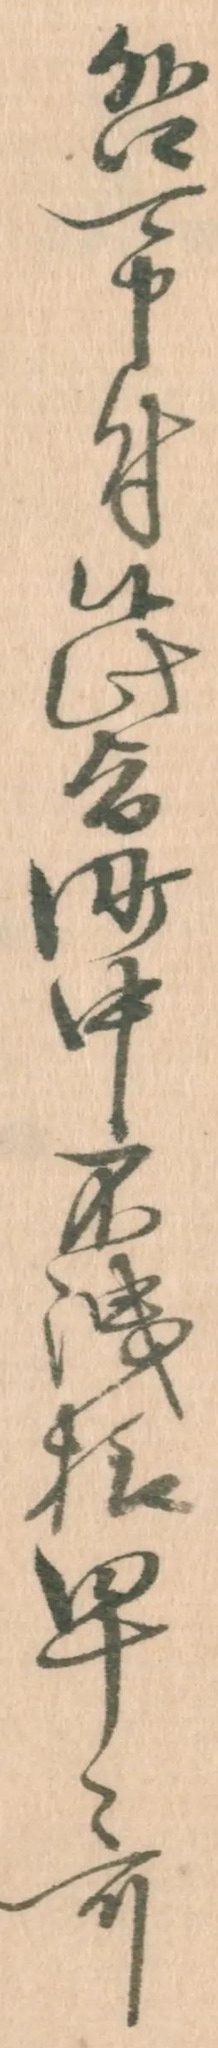咎可申付候此旨町中不洩様早〻可
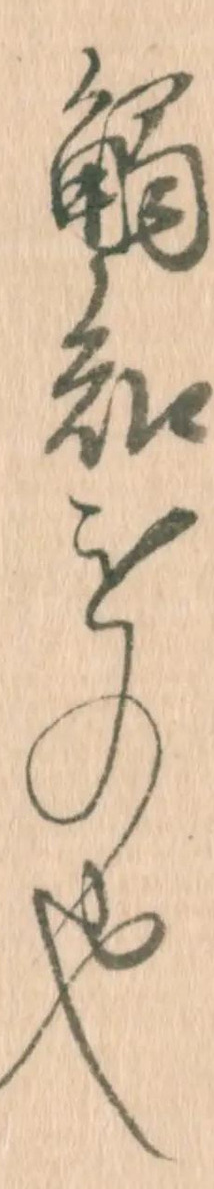触知もの也
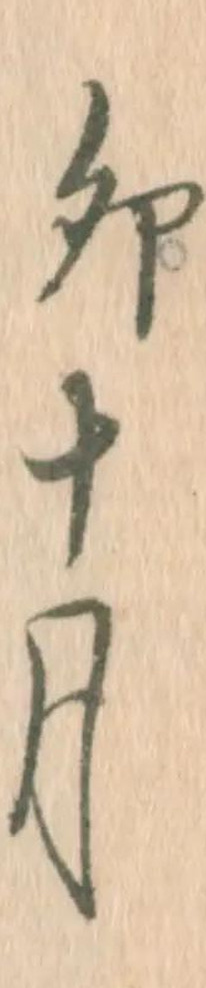卯十月

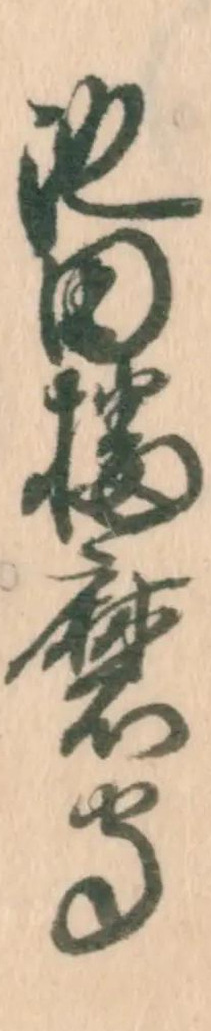│池田播磨守
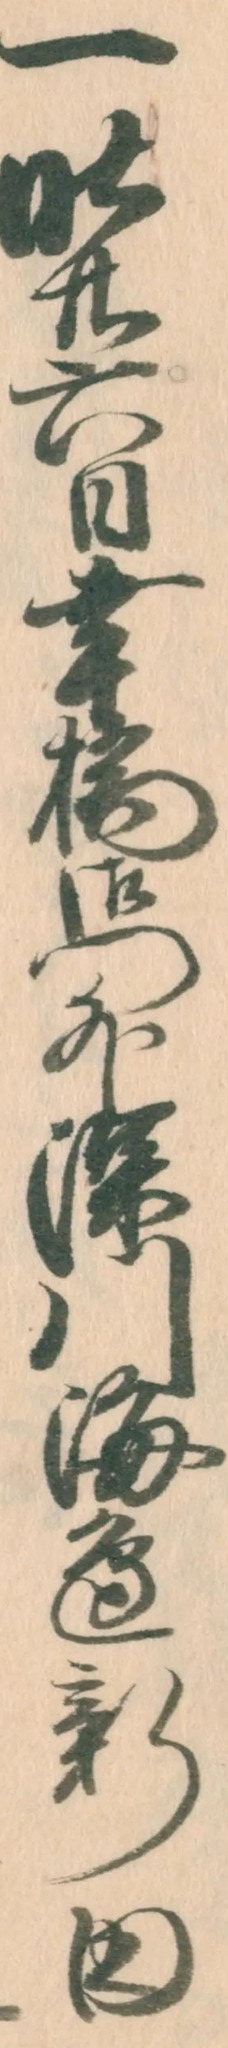一昨廿六日幸橋御門外深川海辺新田
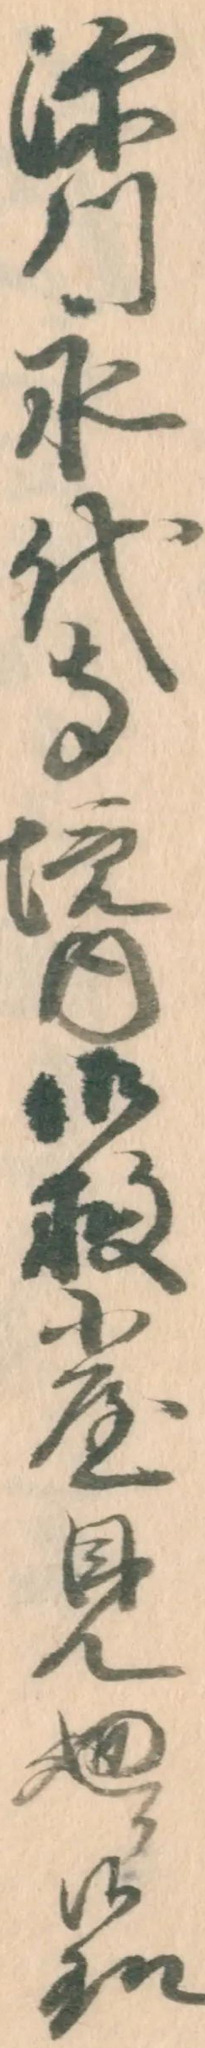深川永代寺境内御救小屋見廻り候処
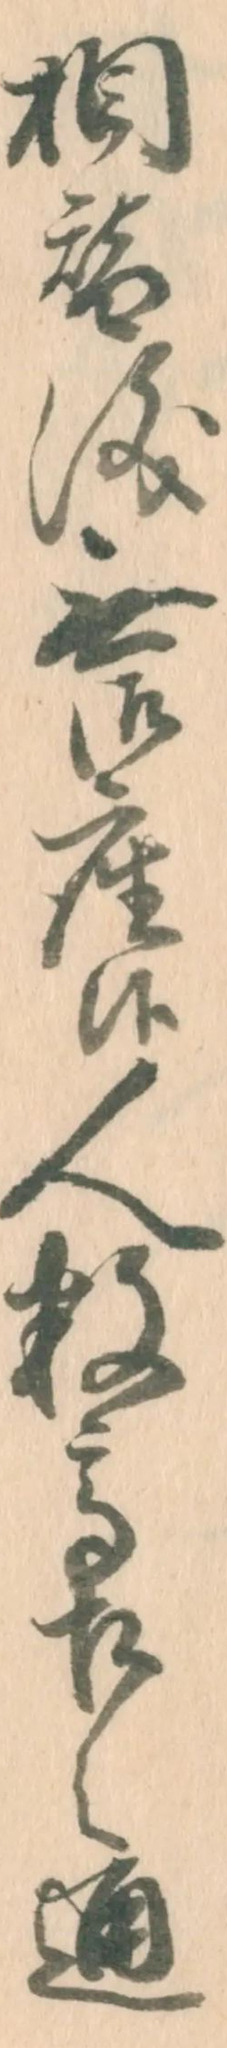相替儀無御座候人数高左之通

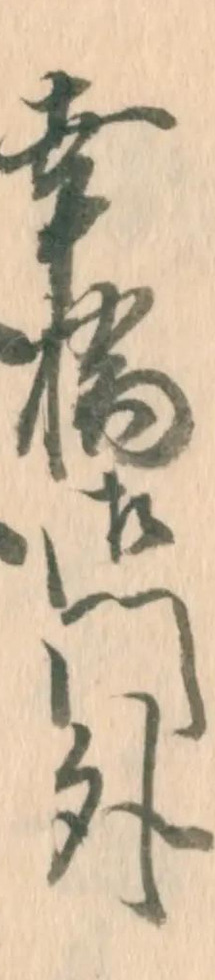幸橋御門外
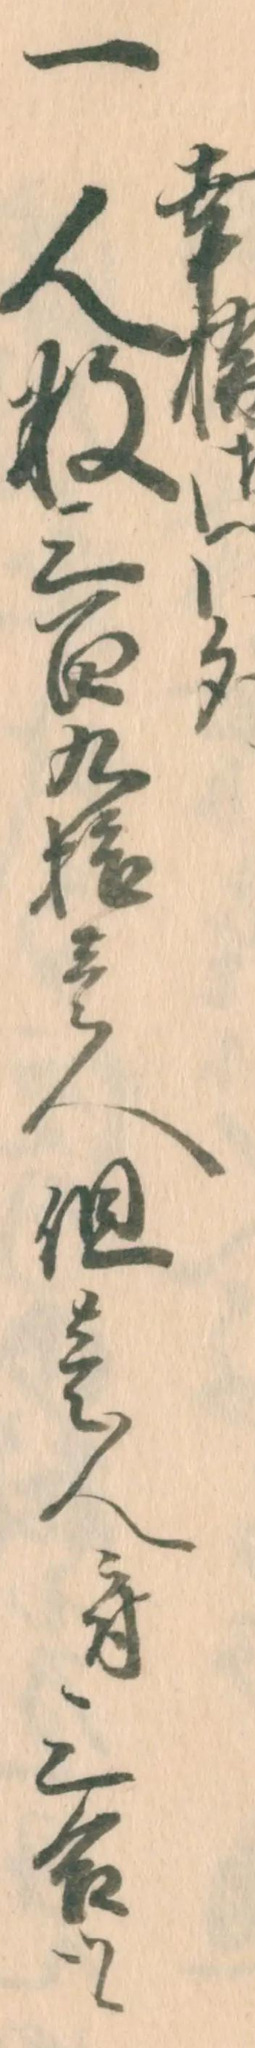一人数三百九拾壱人但壱人ニ付三合ツヽ
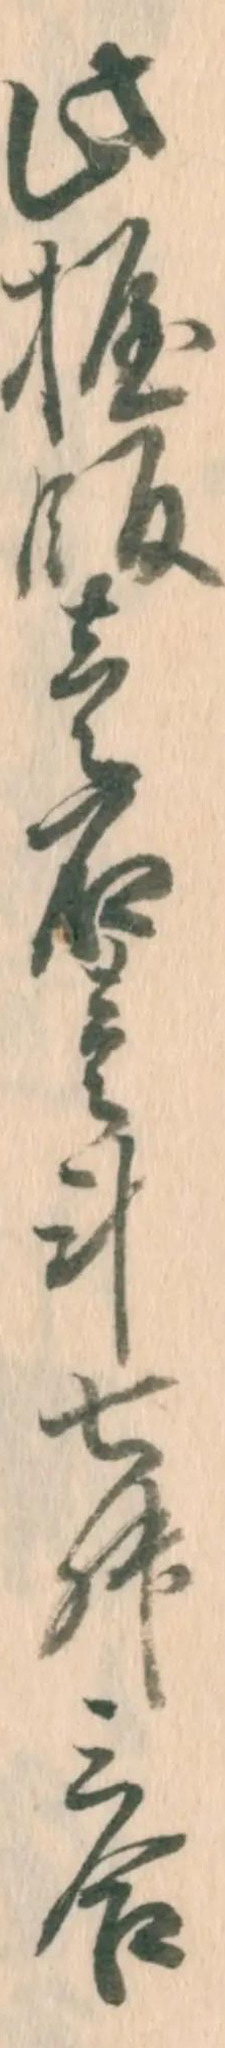此握飯壱石壱斗七升三合
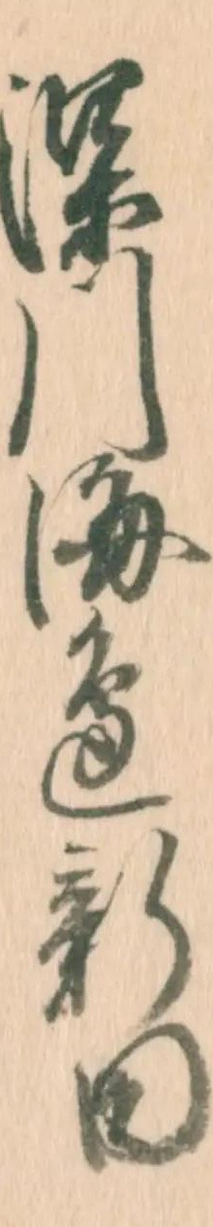深川海辺新田
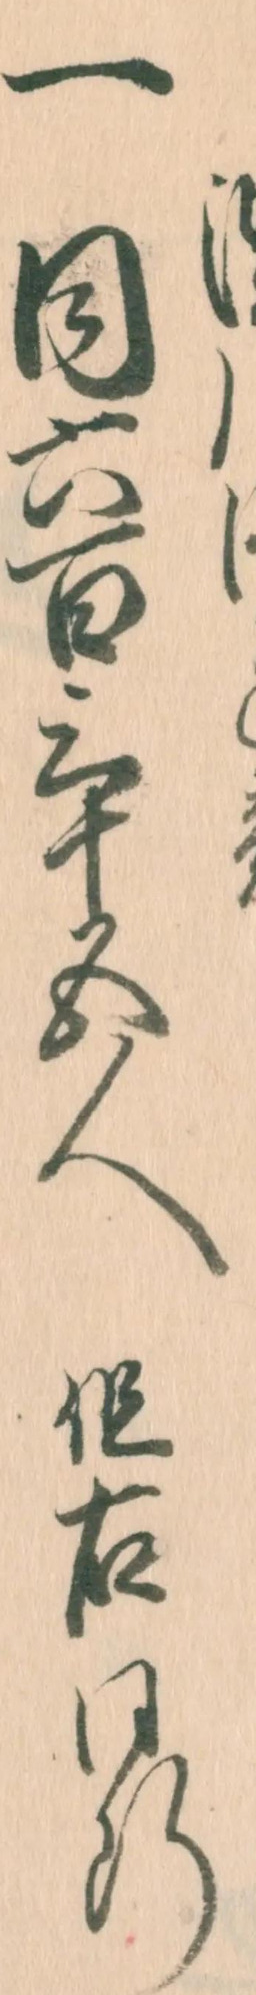一同六百三十五人但右同断
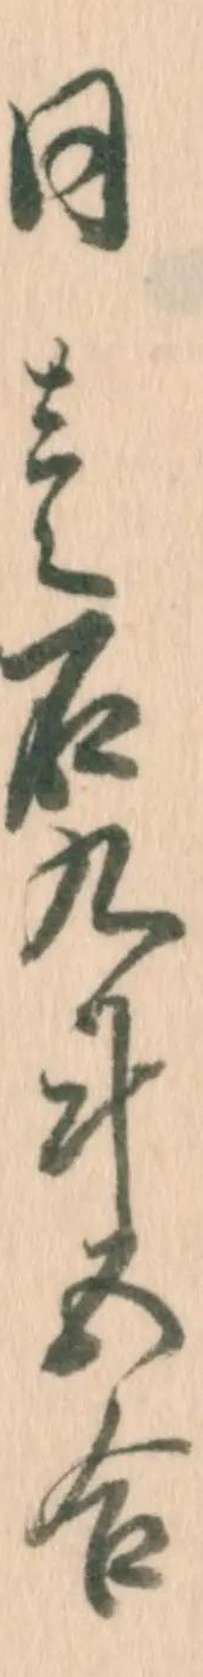同壱石九斗五合
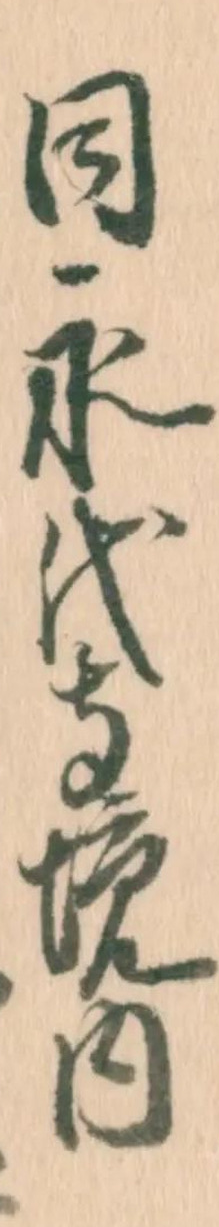同永代寺境内
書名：地震災書留 2巻. [2] 内表紙に「地震一件　安政二卯年十月」とあり
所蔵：国立国会図書館 National Diet Library, JAPAN
